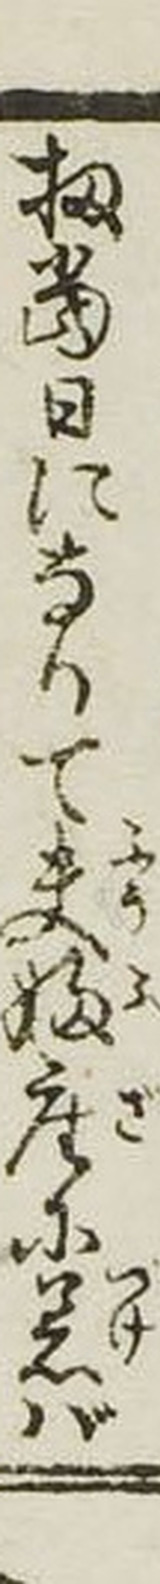扨当日になりて夫婦座に着ば
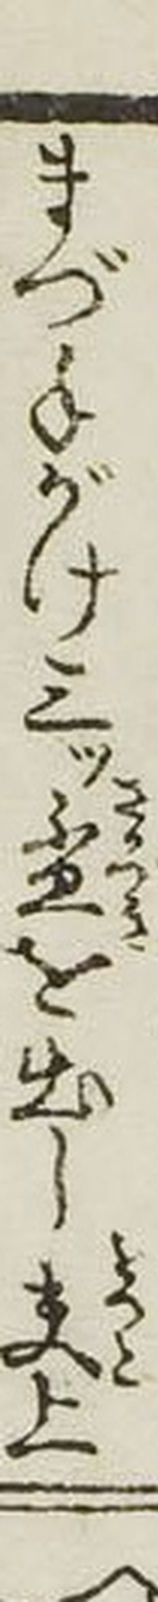まづ手がけ三ッ盃を出し夫上
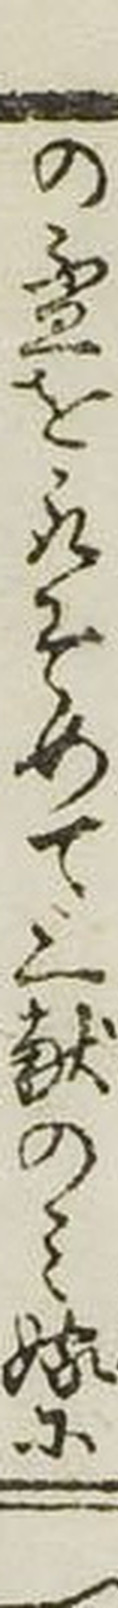の盃を取そめて三献のみ嫁に
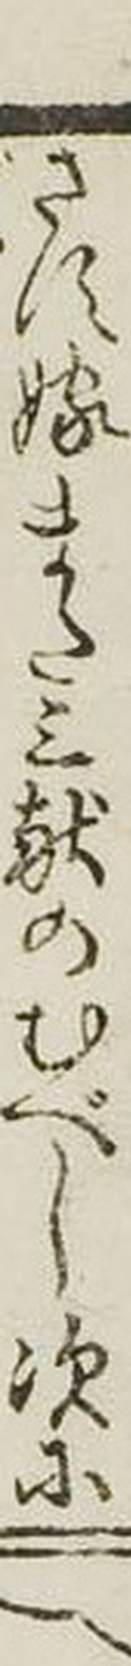さす嫁また三献のむべし次に
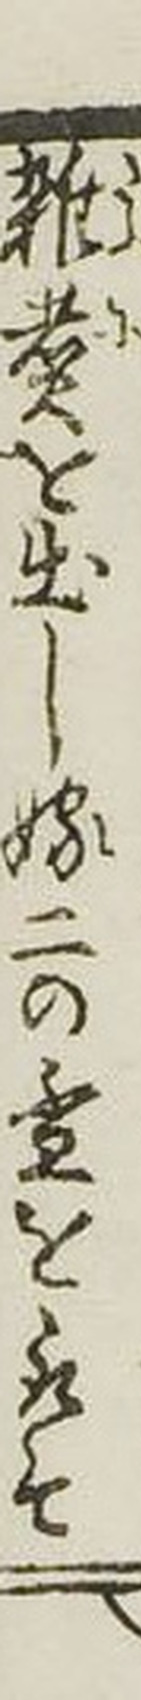雑煮を出し嫁二の盃を取そ
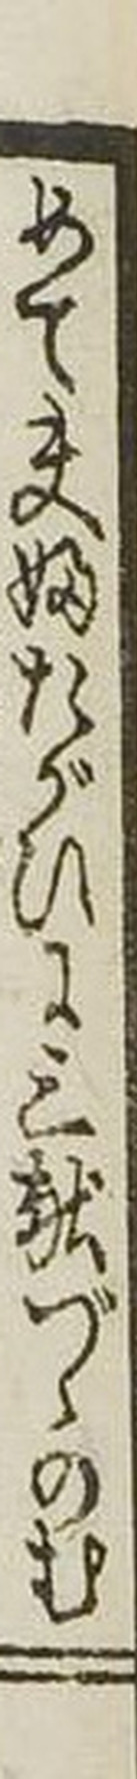めて夫婦たがひに三献づゝのむ
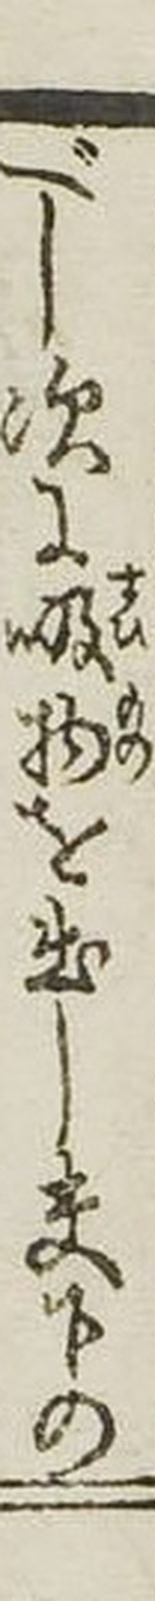べし次に吸物を出し夫下の
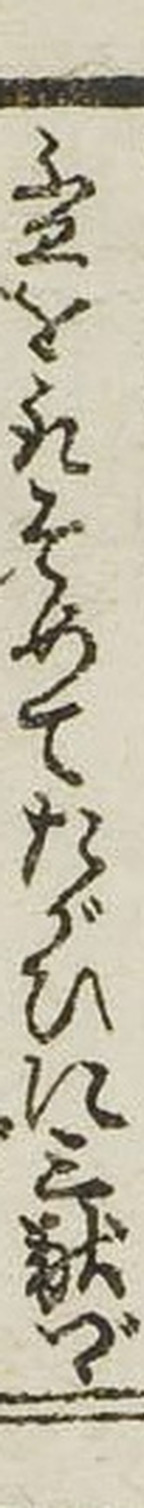盃を取そめてたがひに三献づゝ
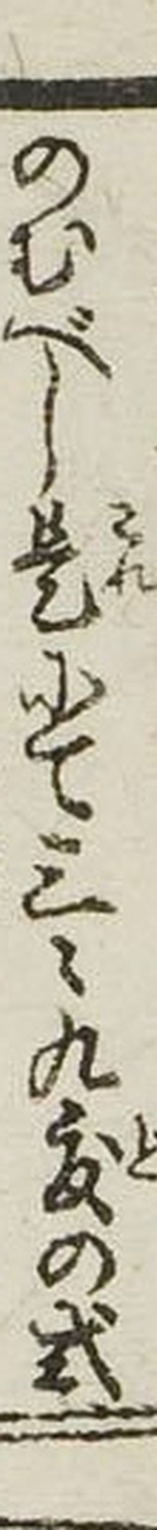のむべし是にて三々九度の式
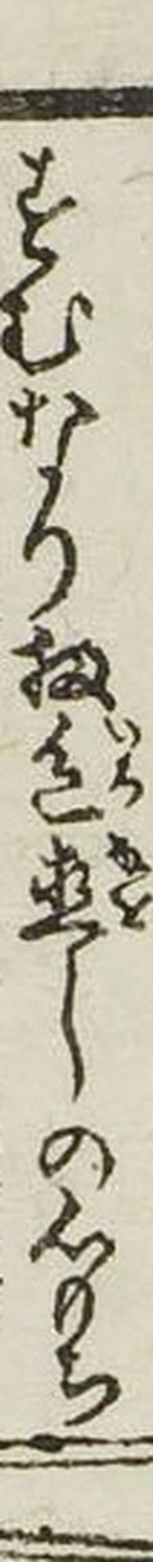すむなり扨色直しの心もち
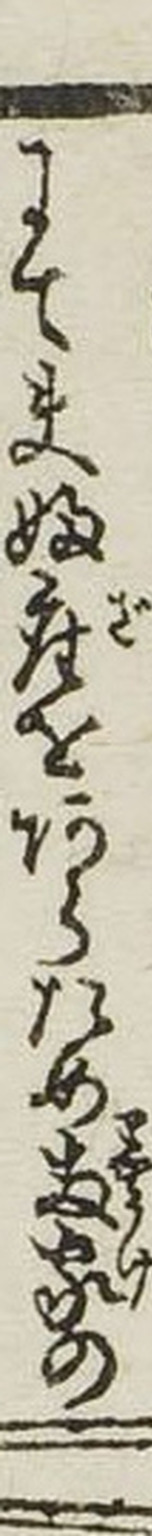にて夫婦座をあらため両家の
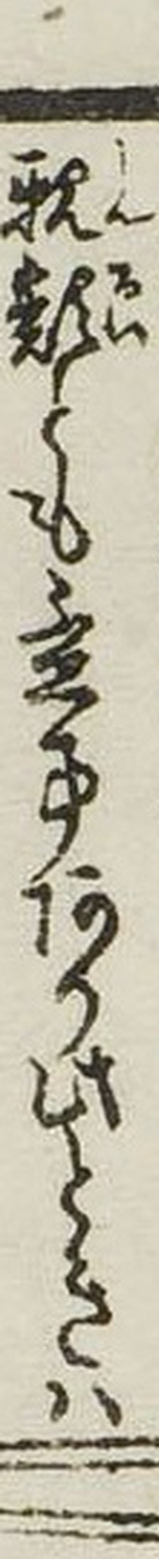親類とも盃事あり此ときは
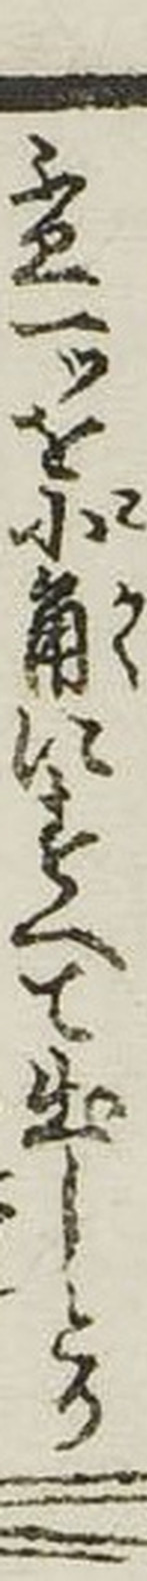盃一ッを小角にすへて出しとり
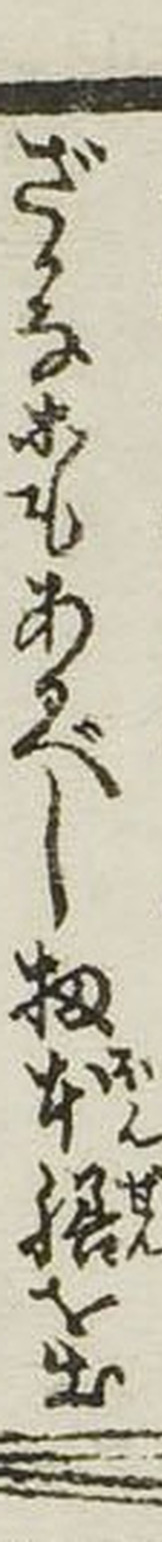ざかな等もあるべし扨本膳を出
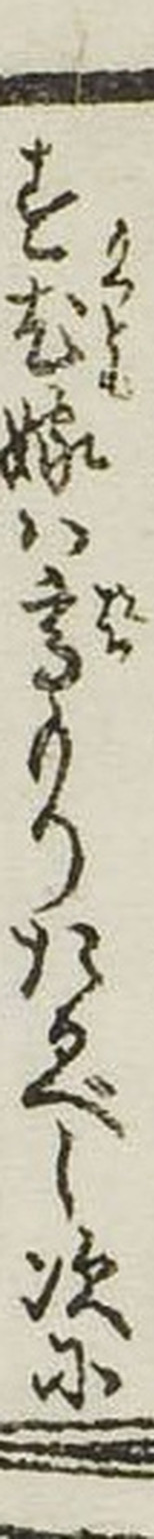す尤嫁は高もりたるべし次に
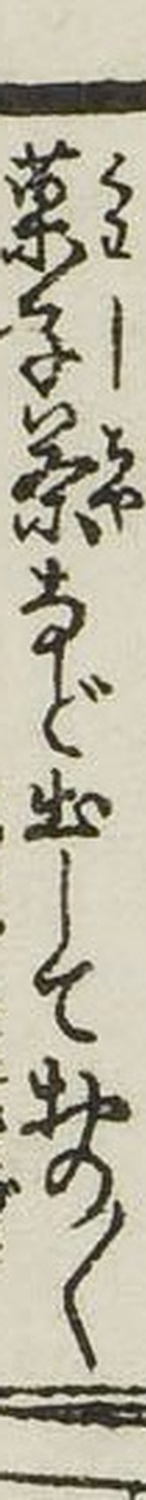菓子茶など出しておの〳〵
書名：商人書翰便覧
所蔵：東京学芸大学教育コンテンツアーカイブ
